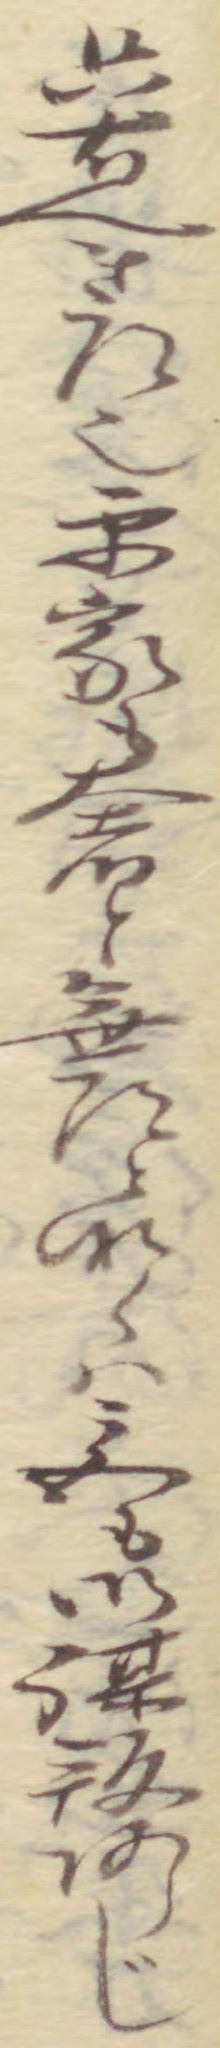只有へき道也平家も奢と無道となくは宮も御謀叛あらじ
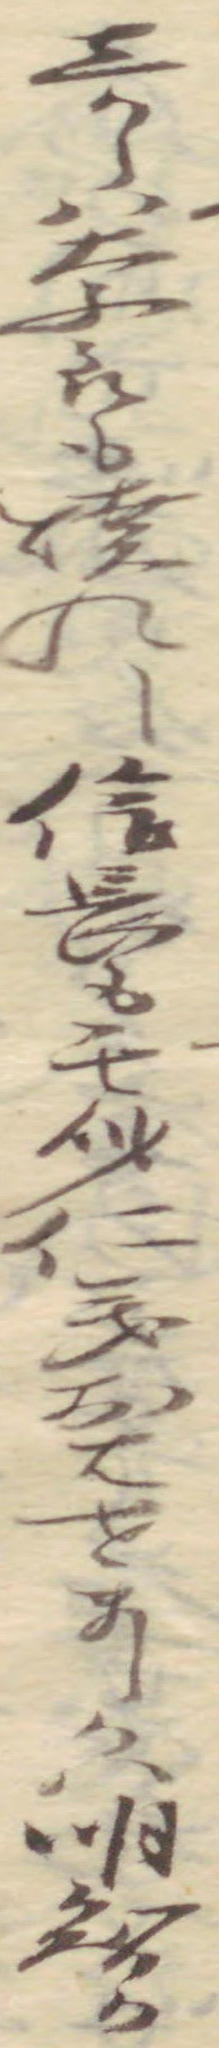しからは奈良も焼れし信長も其身仁義おはせましかは明智か
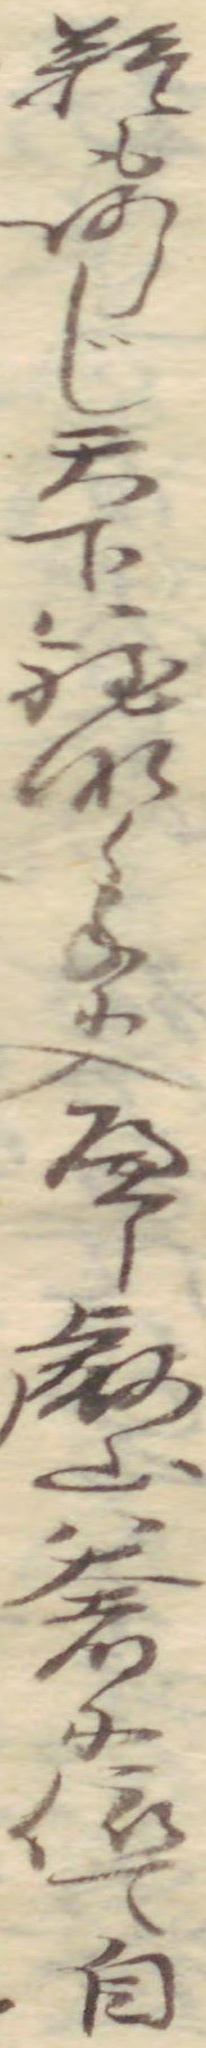難もあらじ天下は程なく手に入へし叡山は奢に依て自
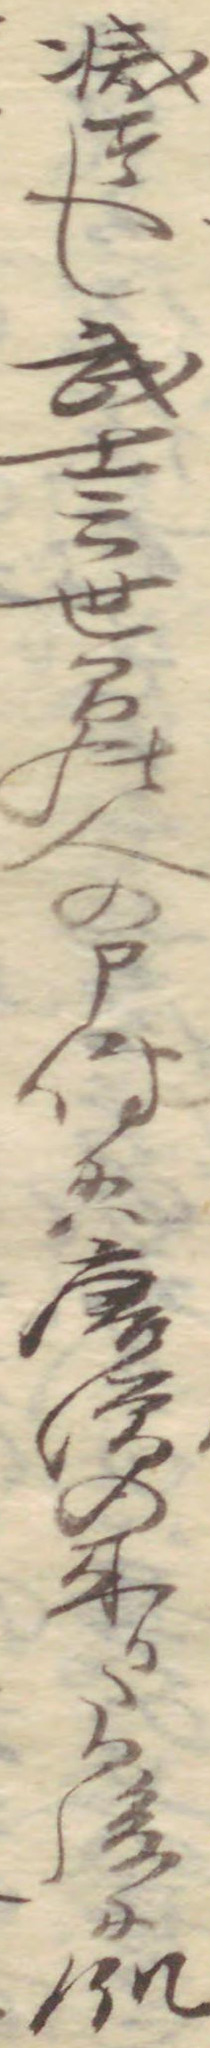滅すへし武士云世間の人の申伝には唐僧の来りたる後に飢
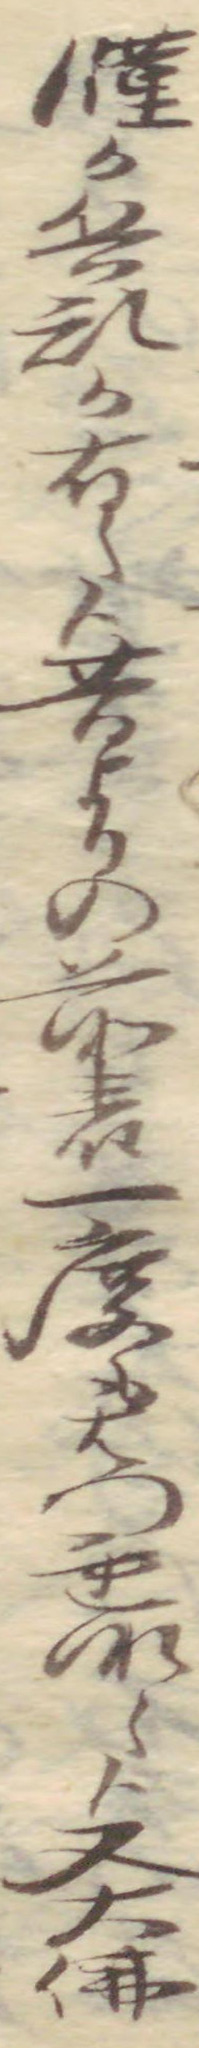饉か兵乱か有之候昔よりの前表一度もはつれなく候又大仏
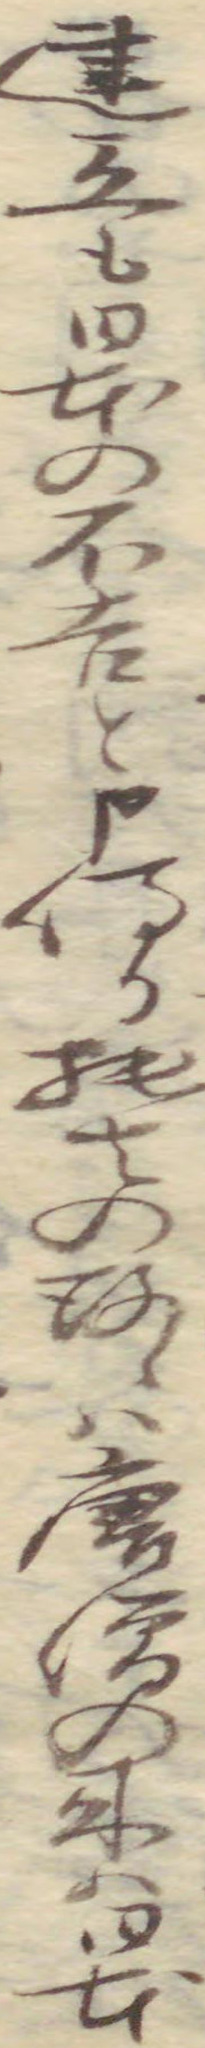建立も日本の不吉と申侍り拙者の存候は唐僧の来は日本
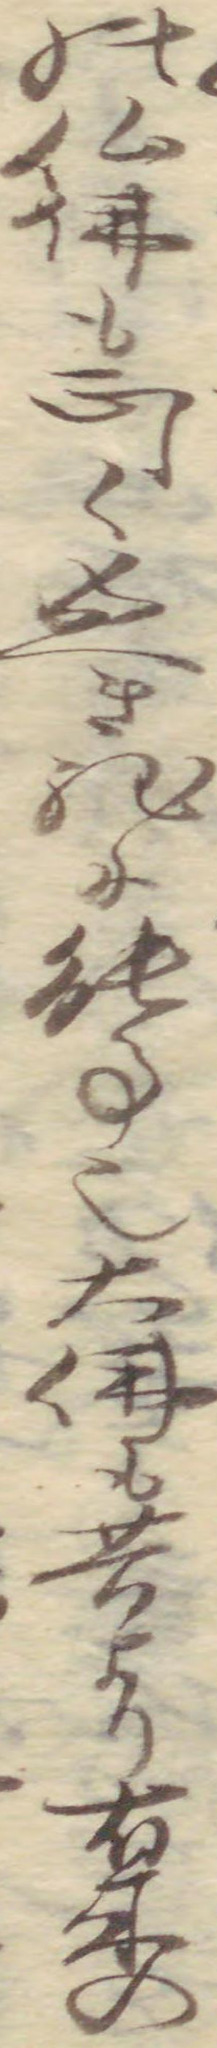の仏法佛も正しく成へき程に能事也大仏も昔より有来の
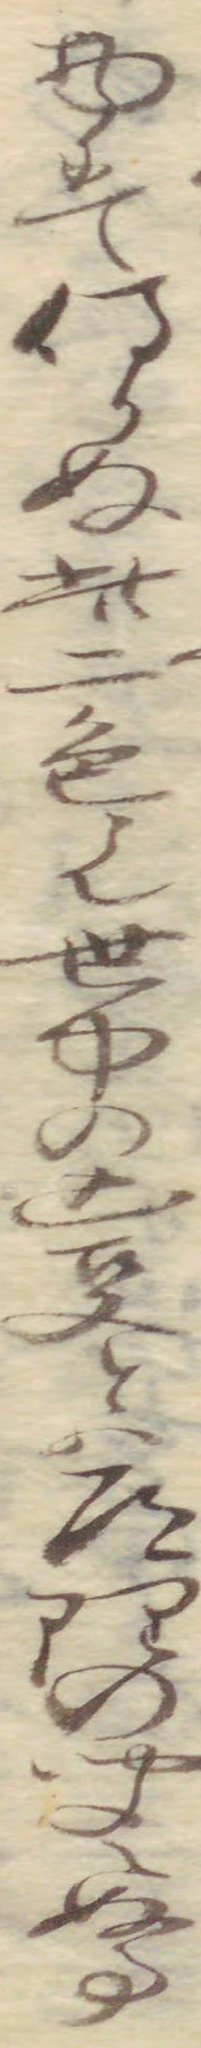物にて侍りぬ此二色にて世中の凶事とは道理の聞えぬ事
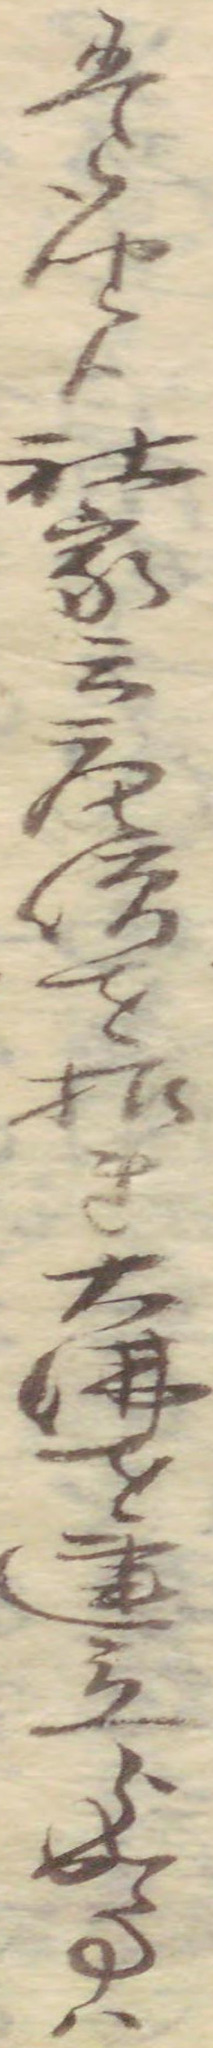にて御座候社家云唐僧を招き大仏を建立被成事は
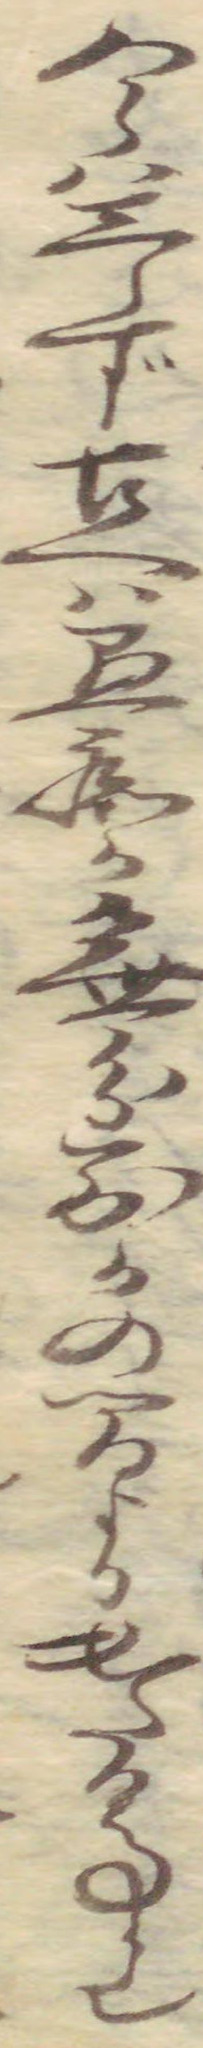今はしらず古へは愚痴か無分別かの間より出たる事にて
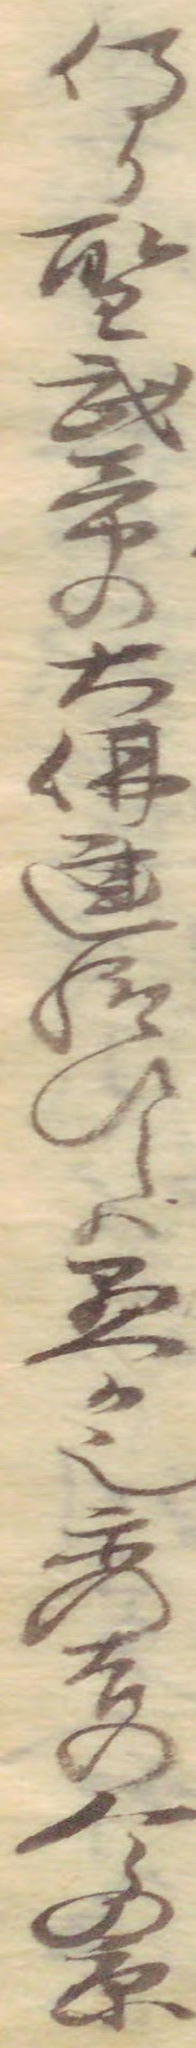侍り聖武帝の大仏建給ひしは愚か也秀吉の今の京

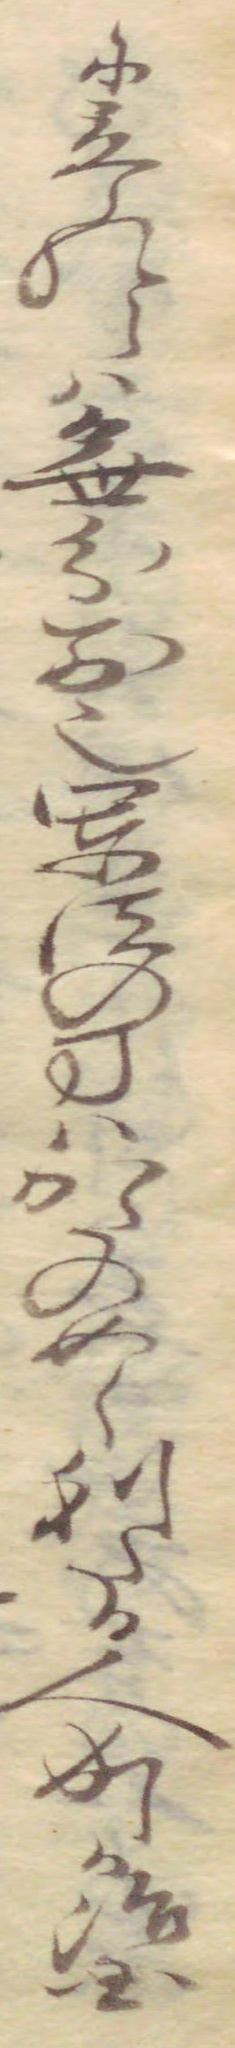に立られしは無分別也軍法の方はかたの如く利たる人成しか治国
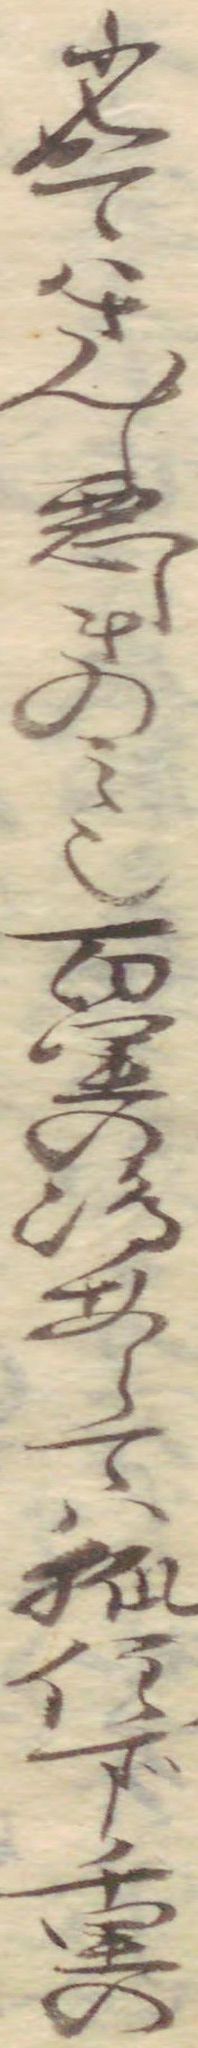に成てはさん〳〵悪しきのみ也百里の島ならては狐住ず千里の
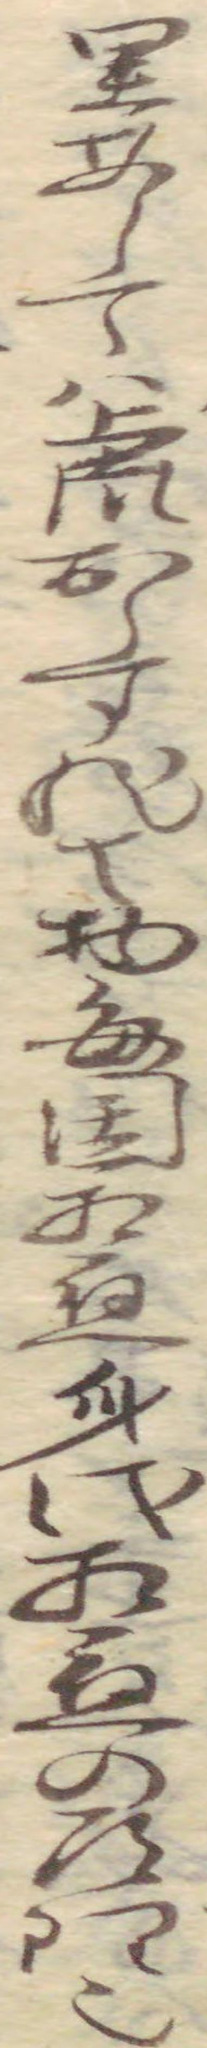里ならては虎おらす然は物毎国相応身代相応の道理也
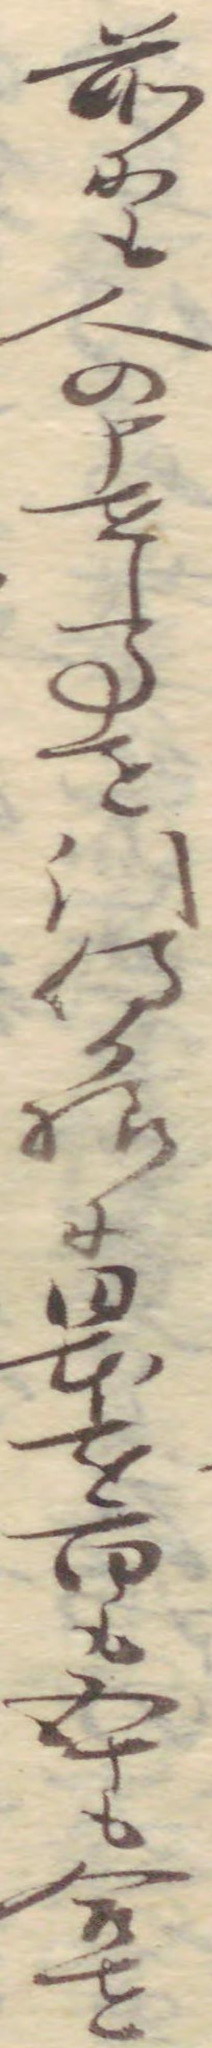前にも人の申せし事を引侍る様に日本を百も五十も合せ
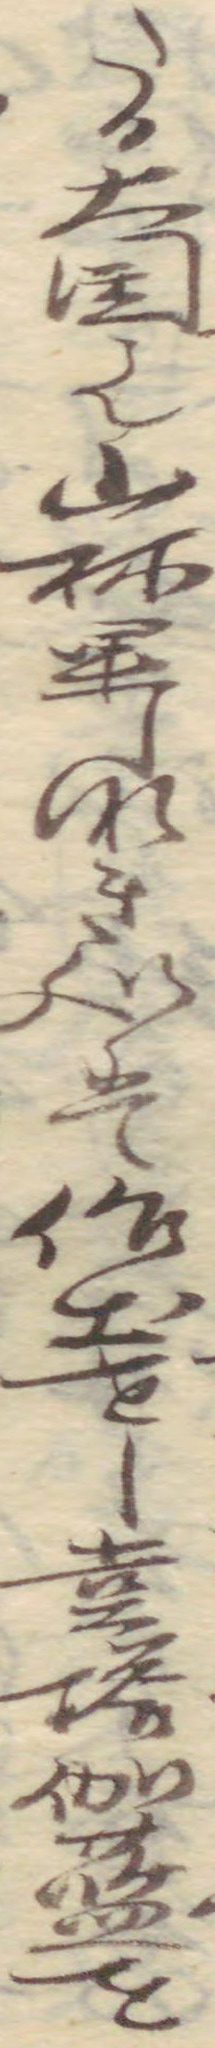たる大国ニて山林果しなき処にて作出せし堂塔伽藍を
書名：鶯宿雑記. 巻263-264
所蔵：国立国会図書館 National Diet Library, JAPAN
